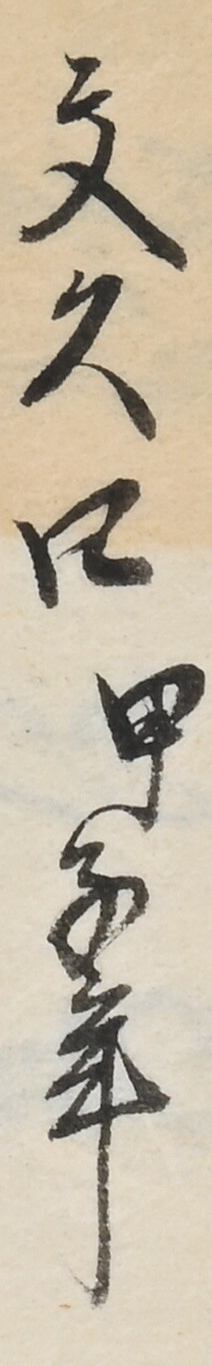文久四甲子年
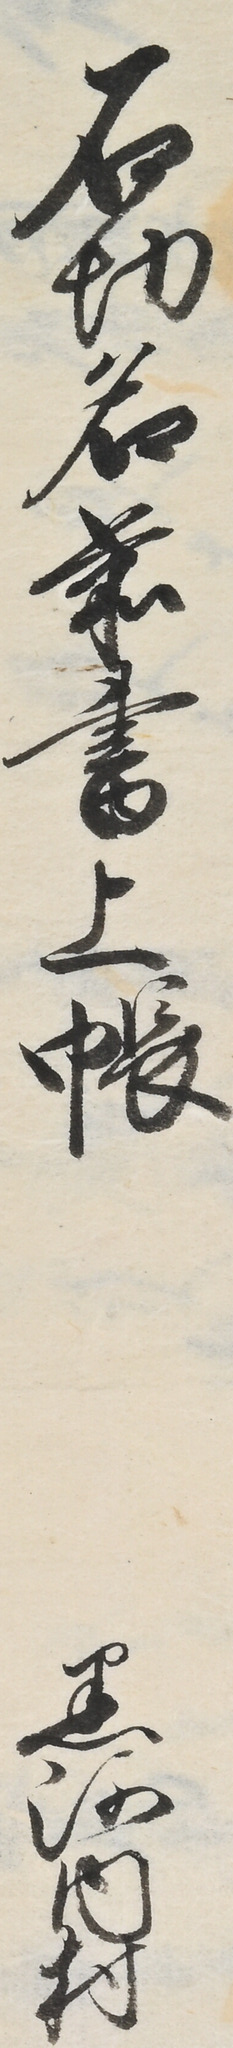石切名前書上帳黒河内村

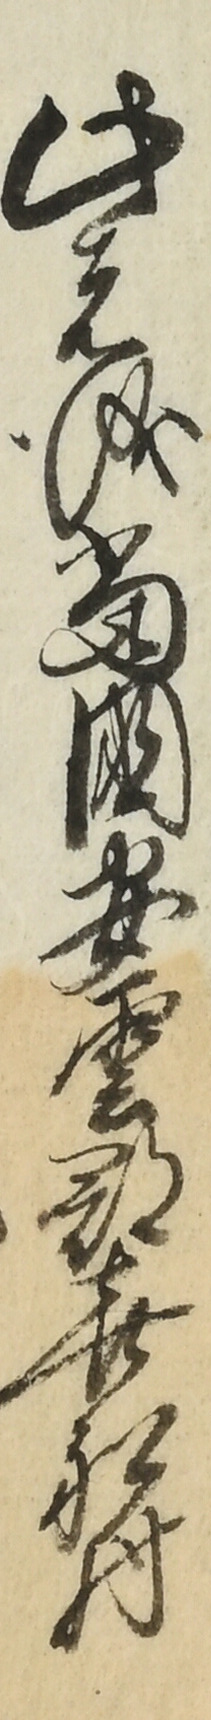此者儀当国安雲郡喜船村
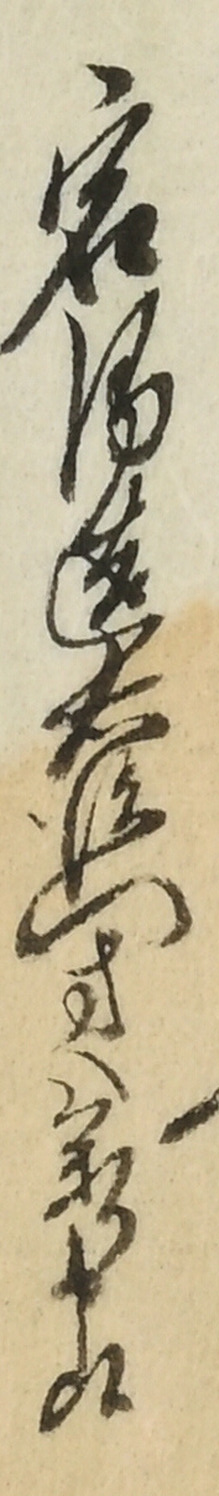宿酒造右衛門方へ参り申候

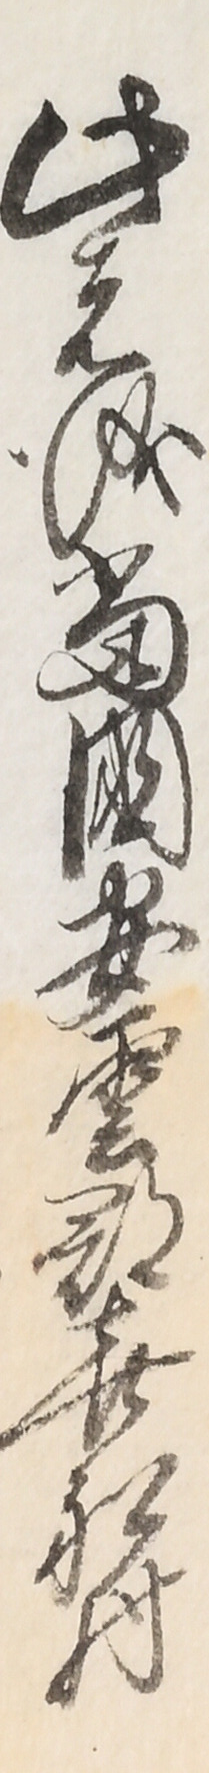此者儀当国安雲郡喜船村
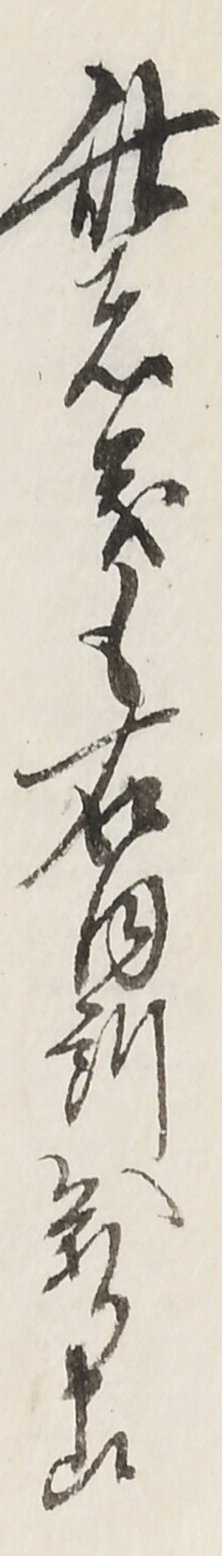此者義も右同所へ参り申候
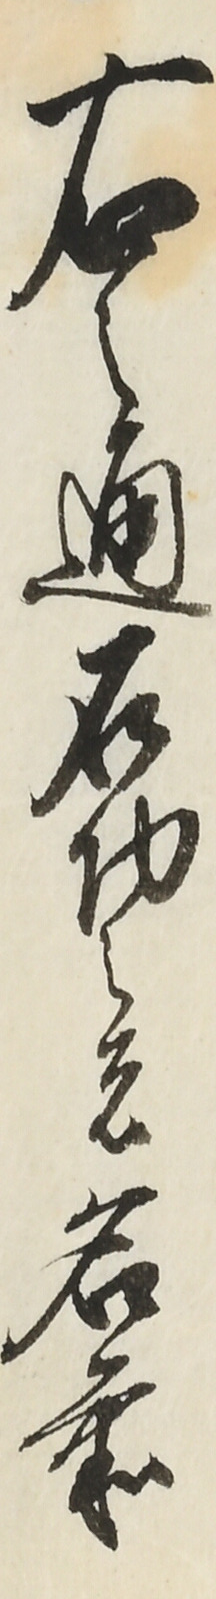右之通石切之者名前
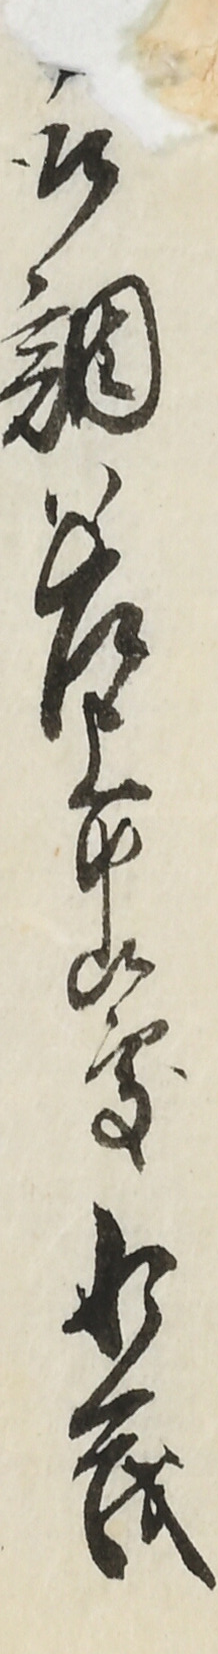取調差上申候処少茂
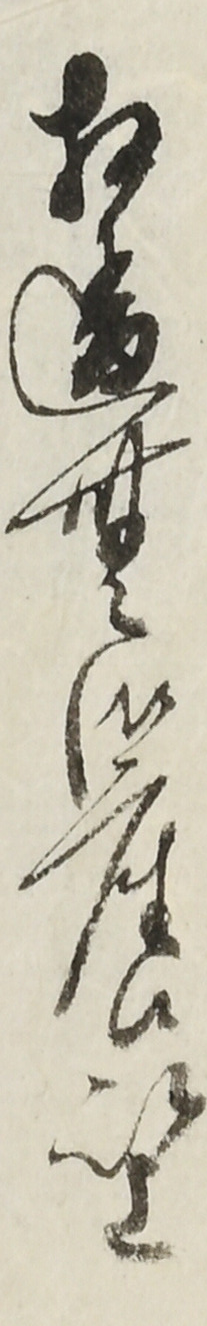相違無御座候以上
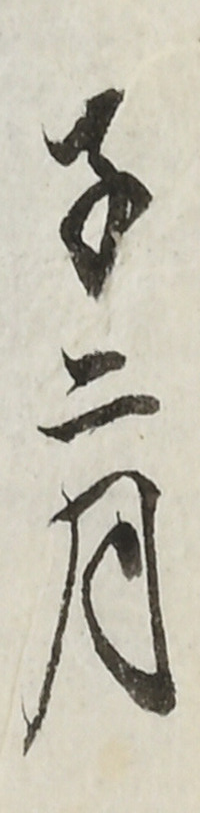子二月

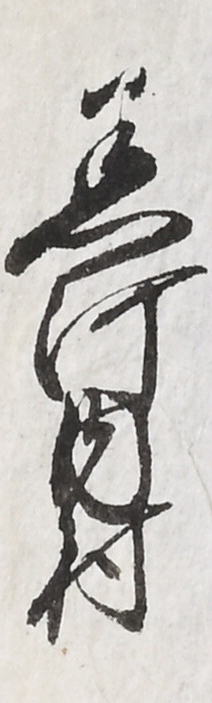黒河内村
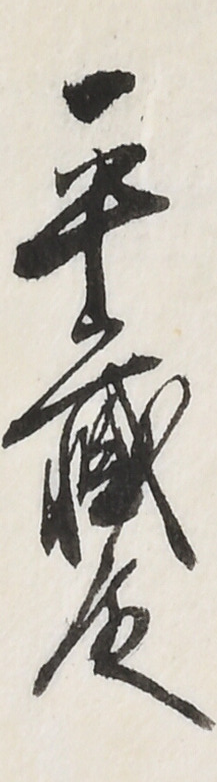平蔵様
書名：文久四甲子年正月石切名前書上帳
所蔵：伊那市立高遠町図書館・合同会社AMANE
